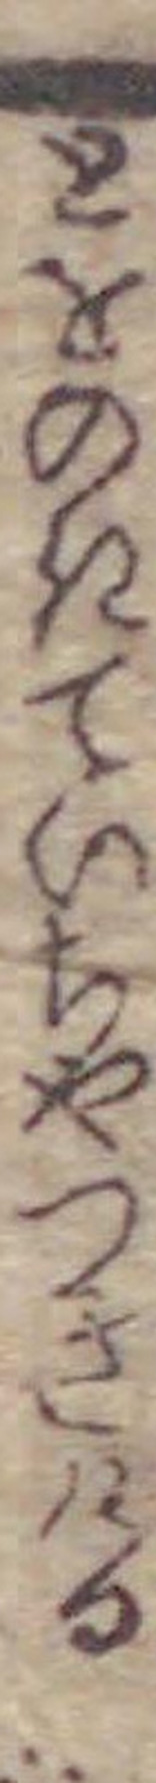とをのきていちやつきける
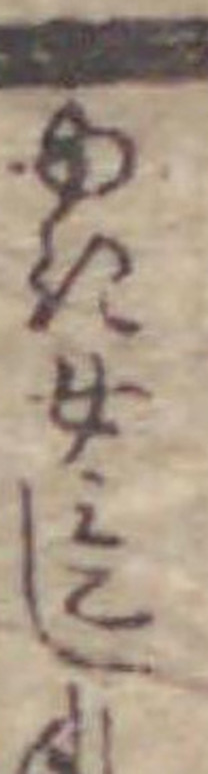ゆきン名みこし
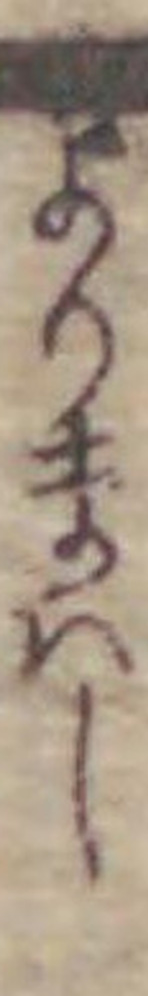よりまはし
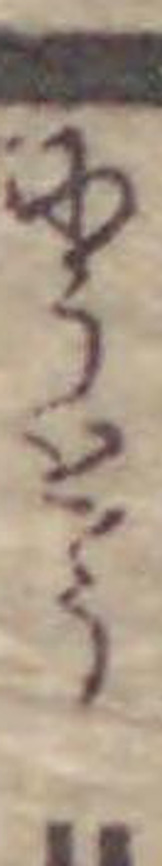にうとう
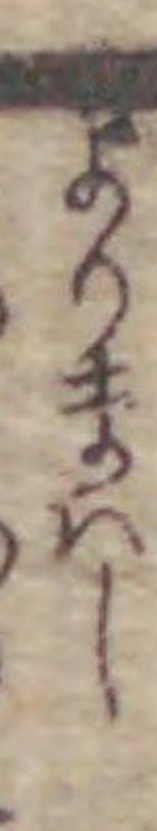よりまはし
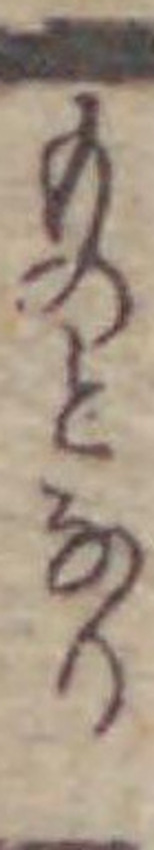ものとなり
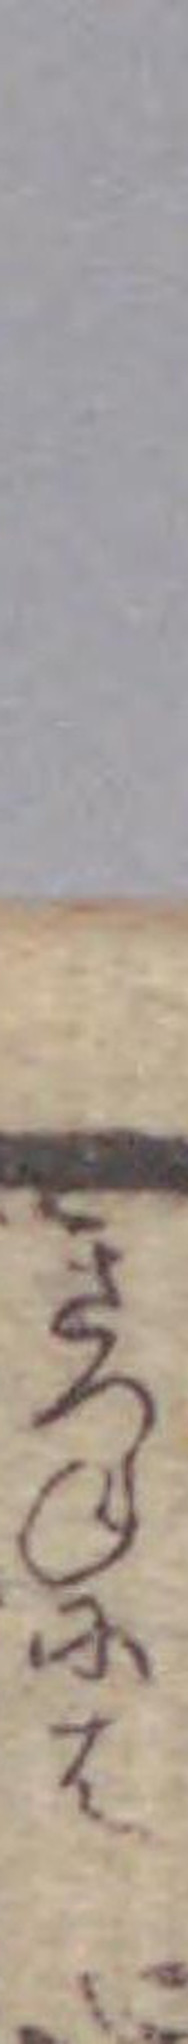きつねには
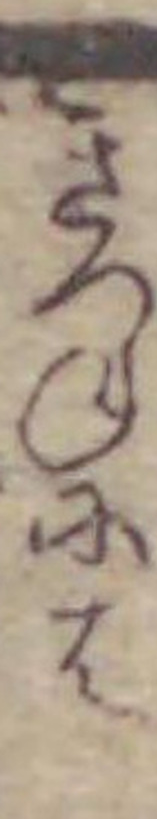きつねには
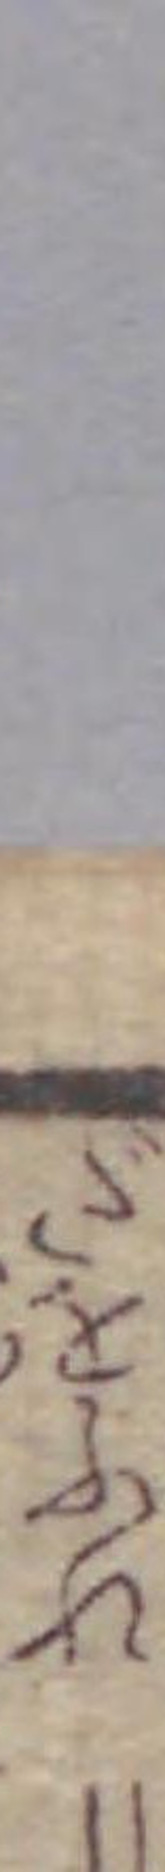だをふれ
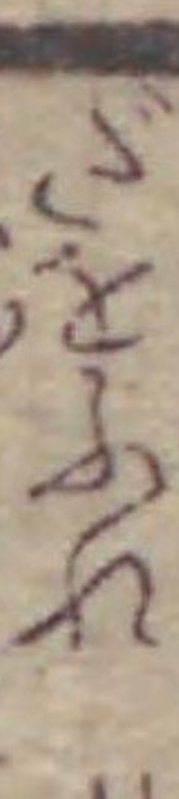だをふれ
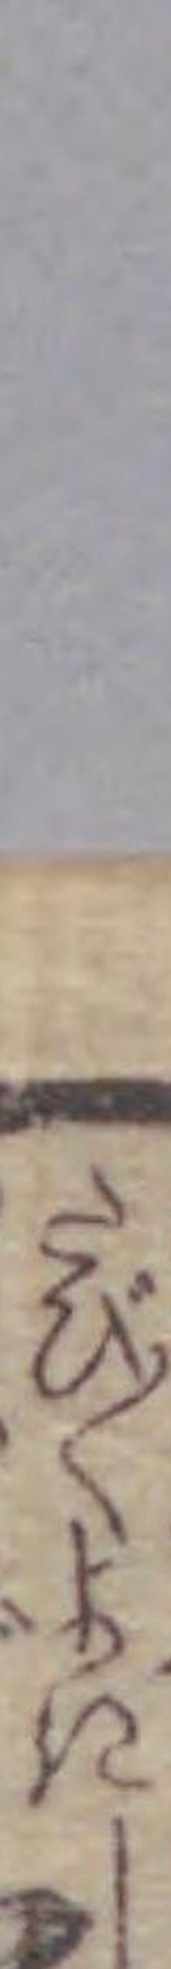たび〳〵よき
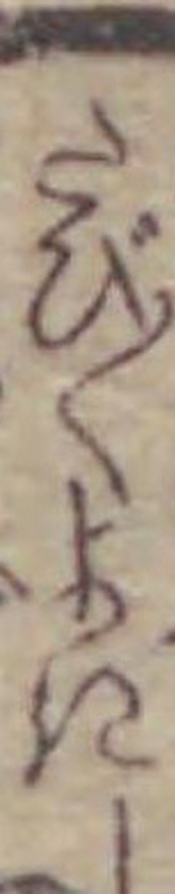たび〳〵よき
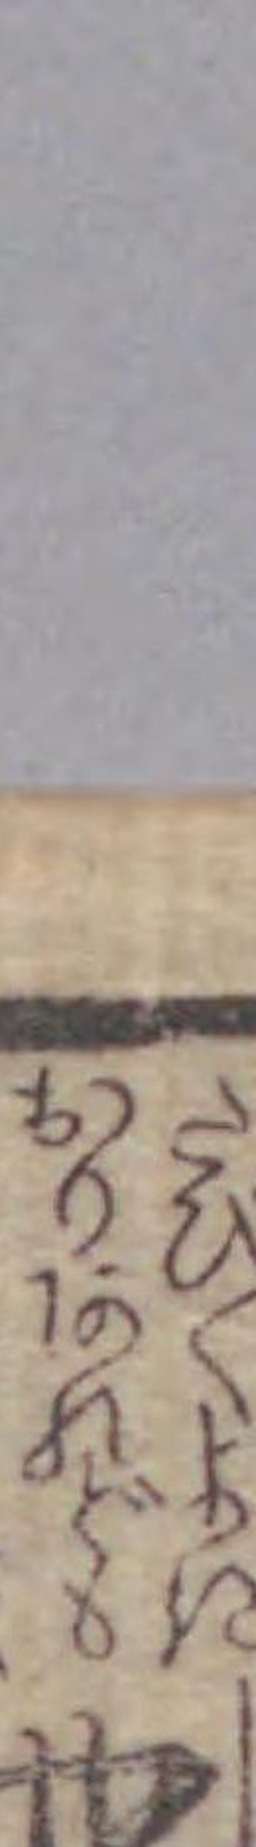おりあれども
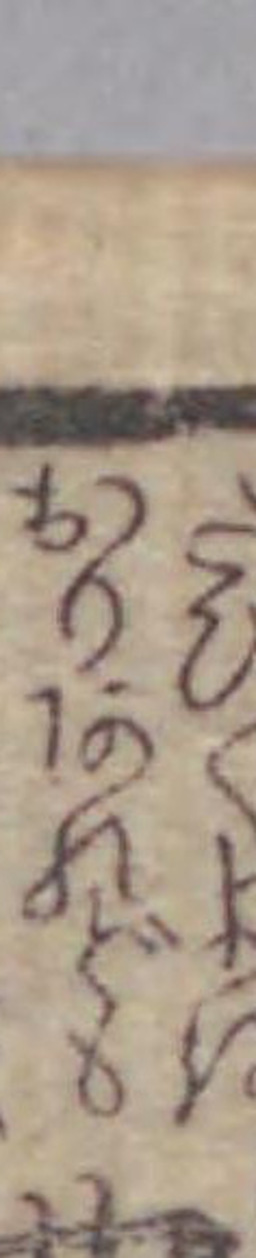おりあれども
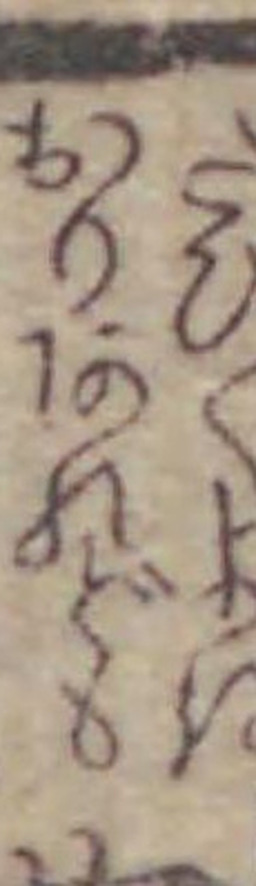おりあれども
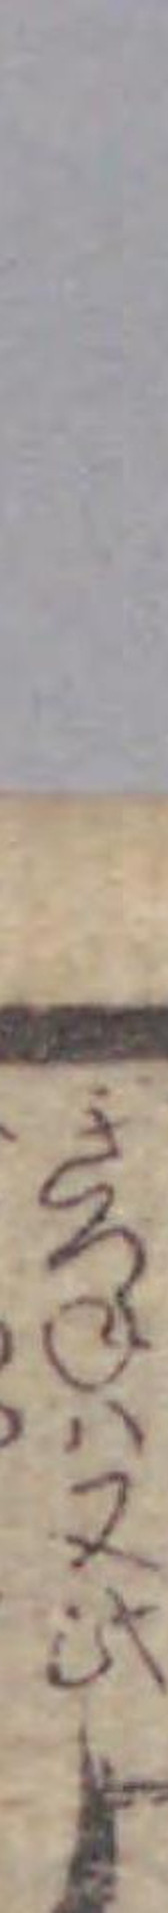きつねは又此
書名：化物仲間破 : 2巻
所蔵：国立国会図書館 National Diet Library, JAPAN
